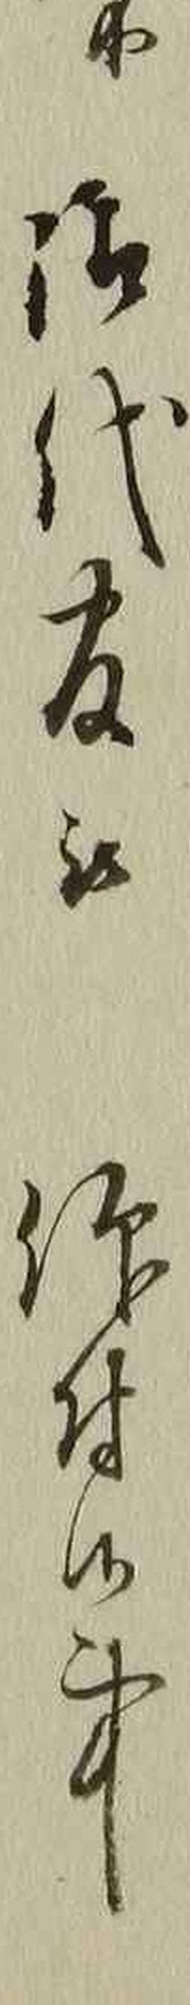組ニ被仰付候事
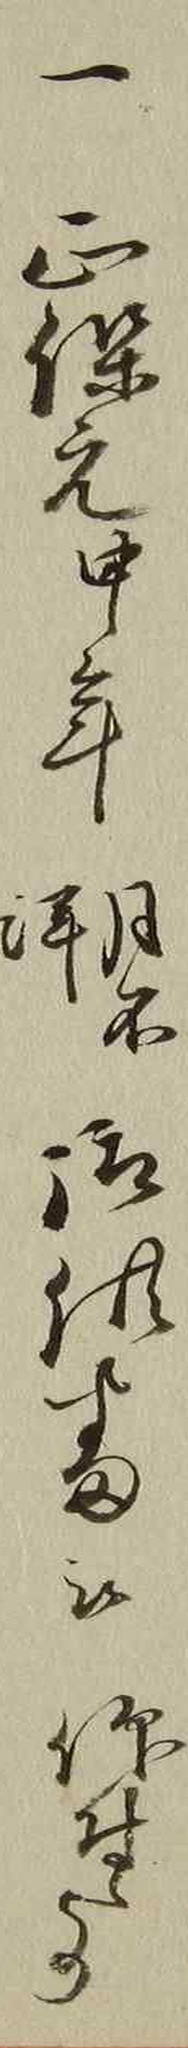一正保元申年月不詳御供番被仰付候事
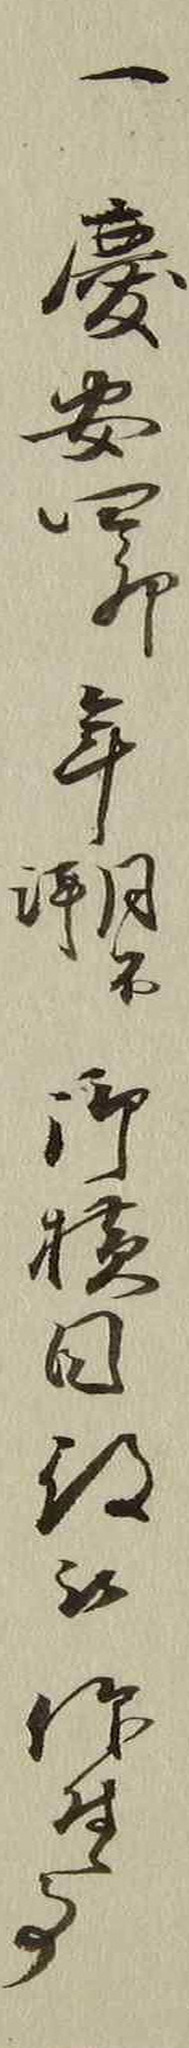一慶安四卯年月不詳御横目役被仰付候事
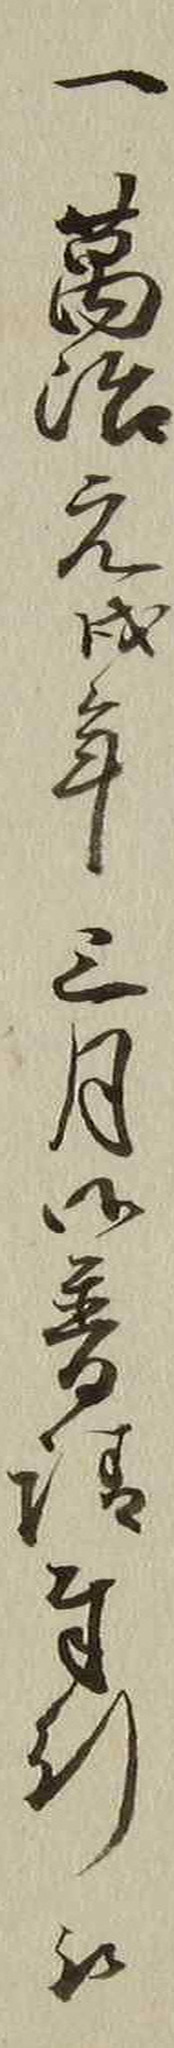一万治元戌年三月御普請奉行被
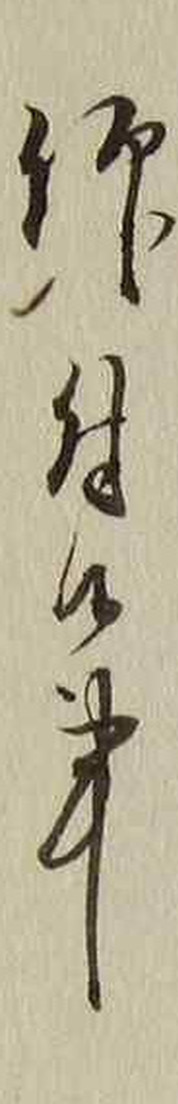仰付候事
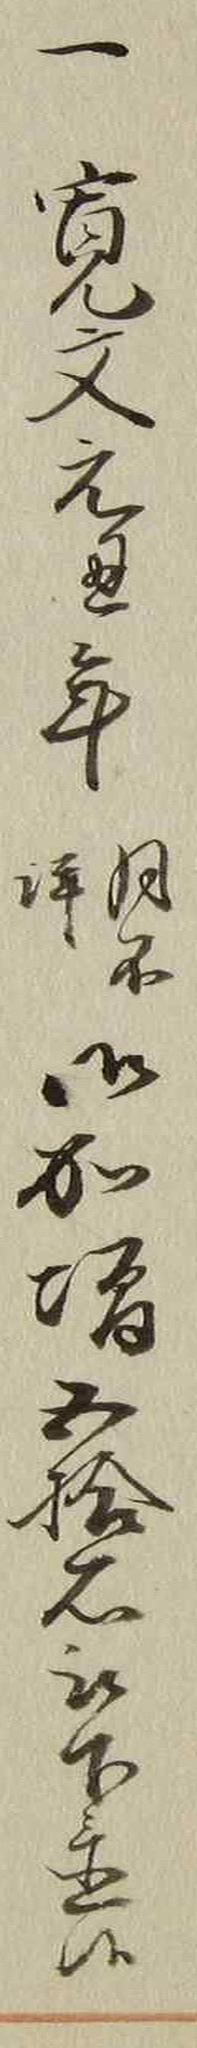一寛文元丑年月不詳御加増五拾石被下置候
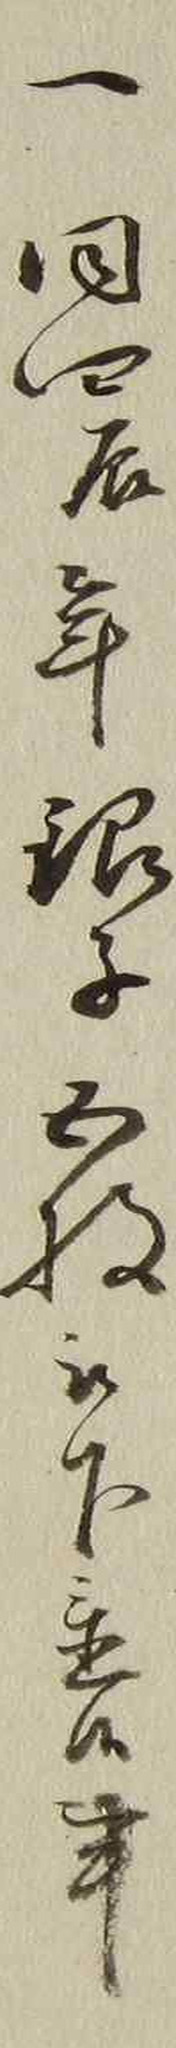一同四辰年銀子五枚被下置候事
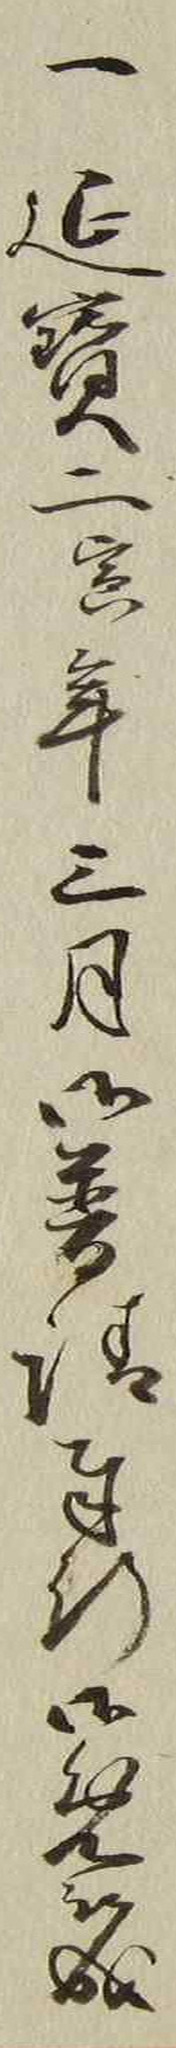一延宝二寅年三月御普請奉行御免被成
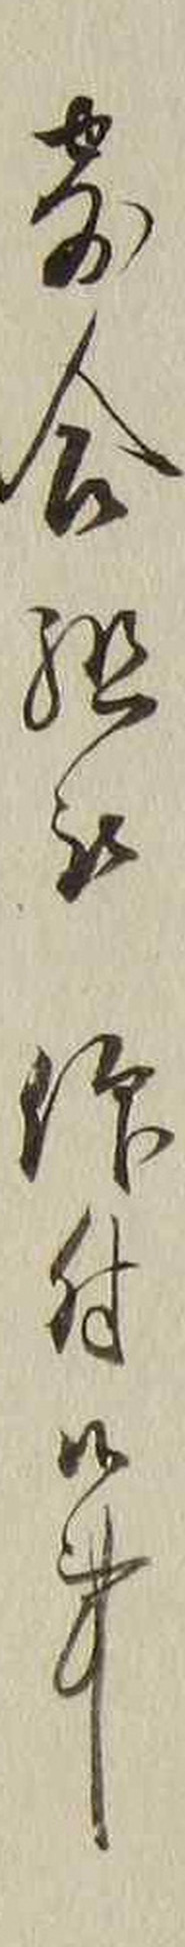寄合組被仰付候事
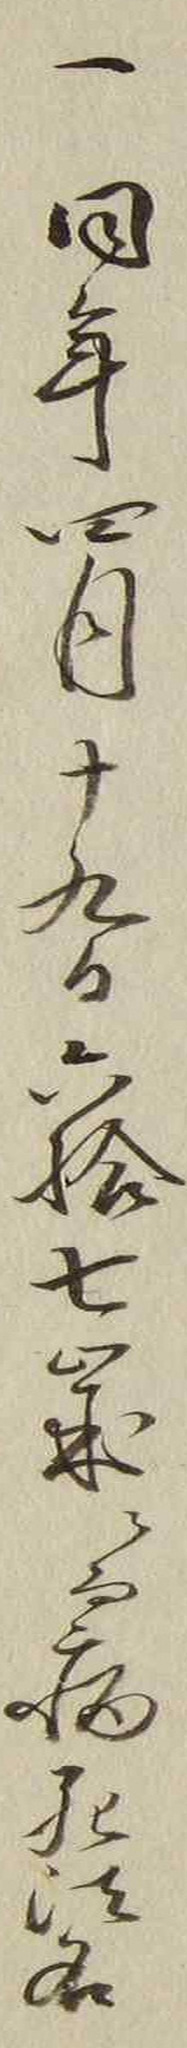一同年四月十九日六拾七歳ニ而病死法名
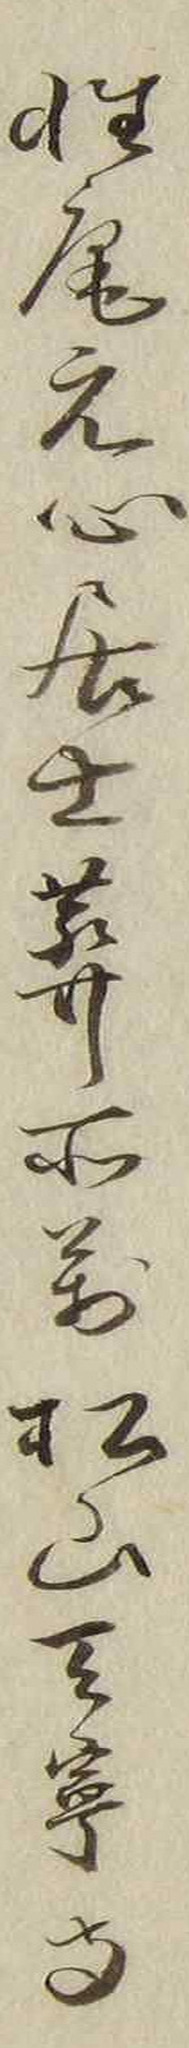性庵元心居士葬所万松山天寧寺

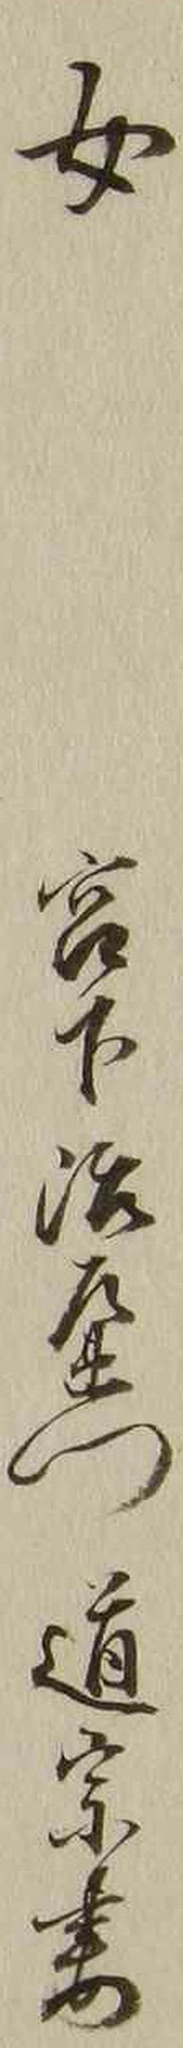女宮下治左衛門道宗妻
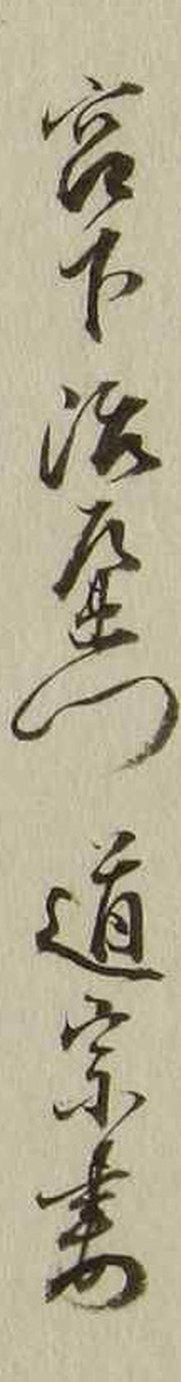女宮下治左衛門道宗妻
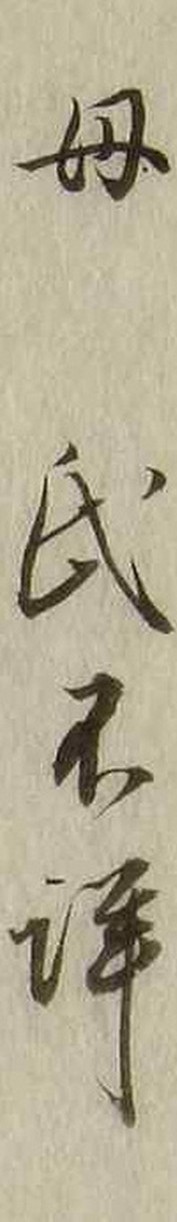母氏不詳
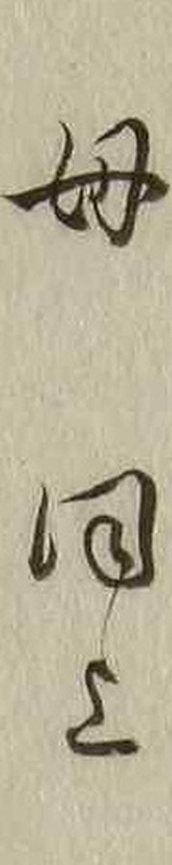母同上
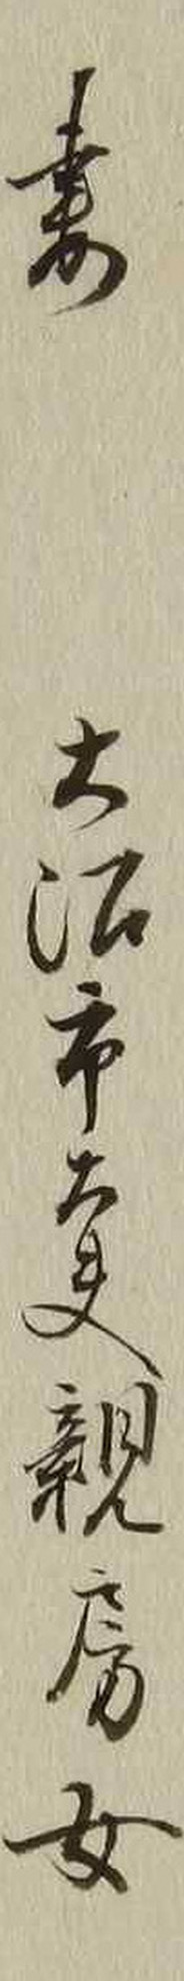妻大沼市大夫親房女
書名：諸士系譜　巻之122　よ之部5
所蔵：会津若松市立会津図書館
